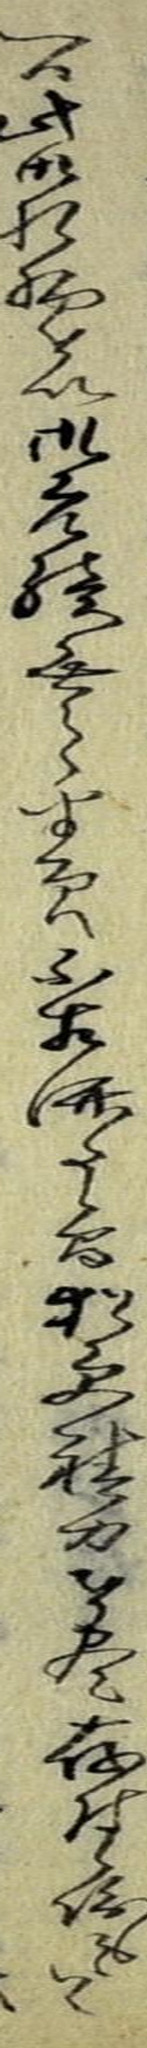へは此御折柄を以御取続無之半而は不相済事に候間猶更精力を尽存付之儀も候はヽ
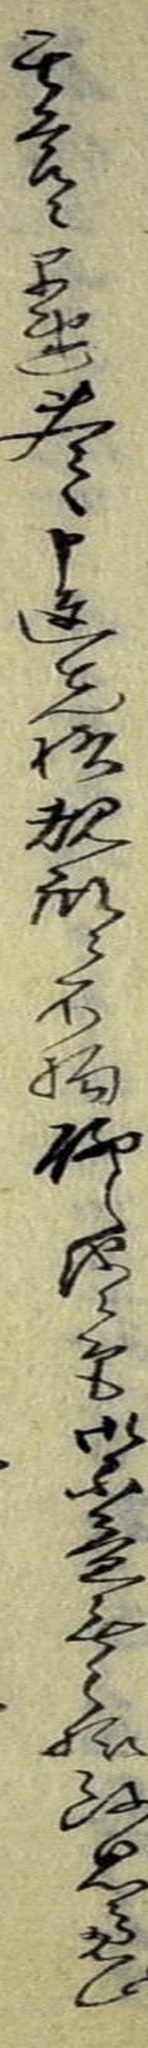其節々早速夫々へ申達先格規形に不拘聊之儀に而も御不益無之様致思慮此
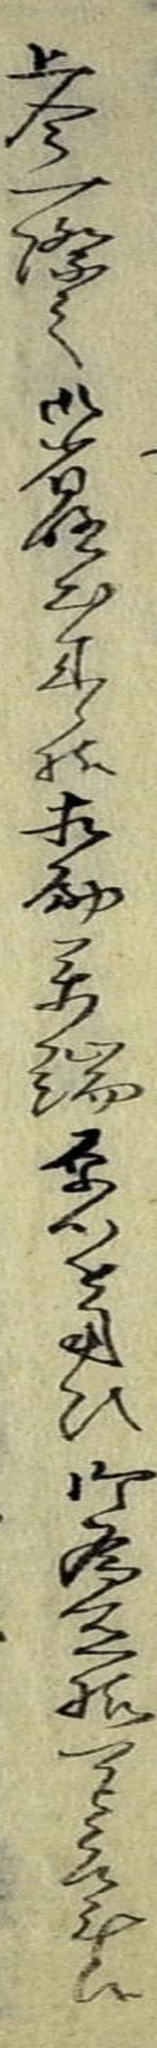上今一際之御省略出来候様相励万端厚心を用ひ御為宜様可被取斗候
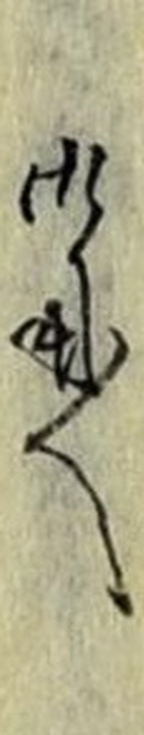御用人
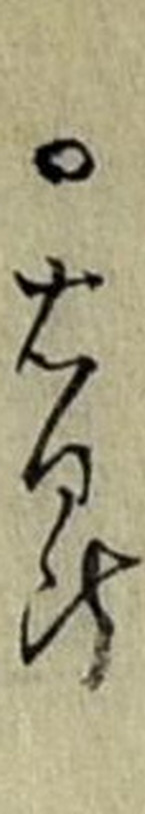○右同断
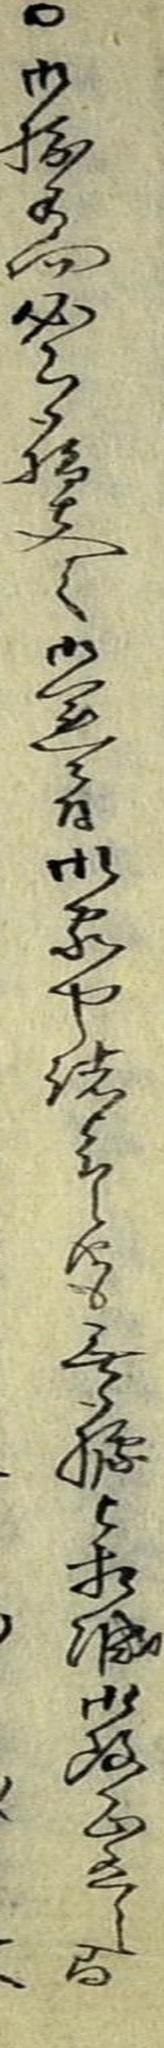○御勝手向必至御指支之御運に付御家中諸被下候儀も無御拠被相減御改正有之候間
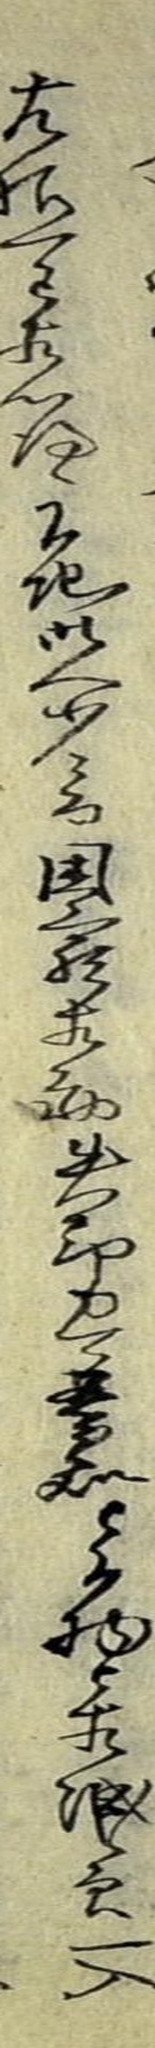左様可被相心得候下地御人少々に而困窮相勤失却為可費候処被下物被相減候而は一入
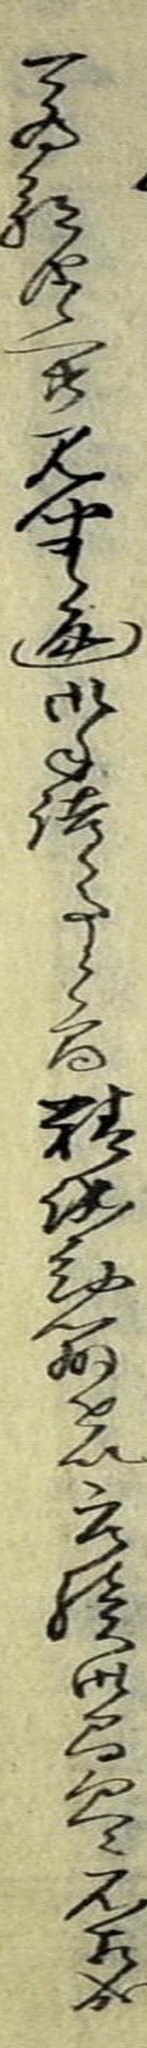可為難儀候へ共見聞候通御手詰之事に候間精誠勘弁を以取続御間欠に不相成
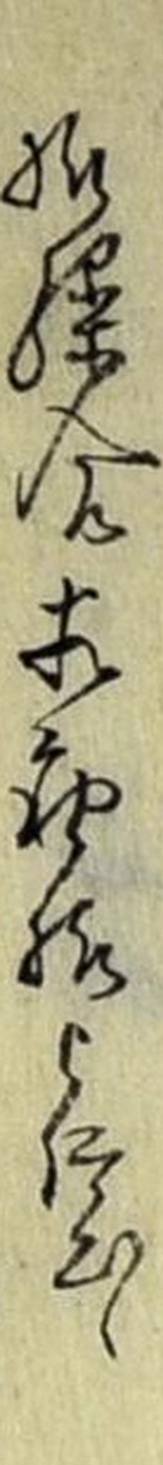様繰合相勤候様被仰出候
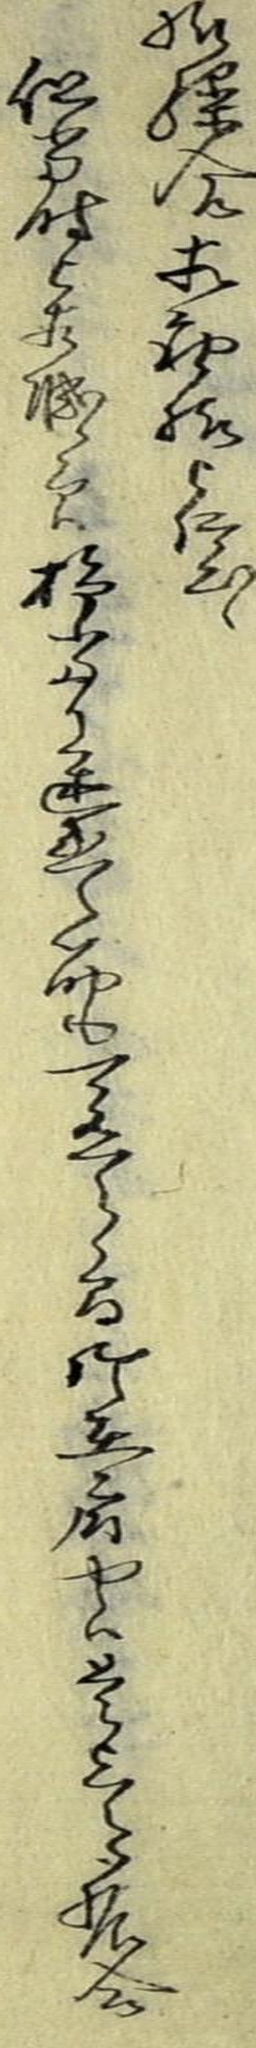但当時被相減候而は指当り迷惑之筋も可有之候間御在府中は是迄之御振合

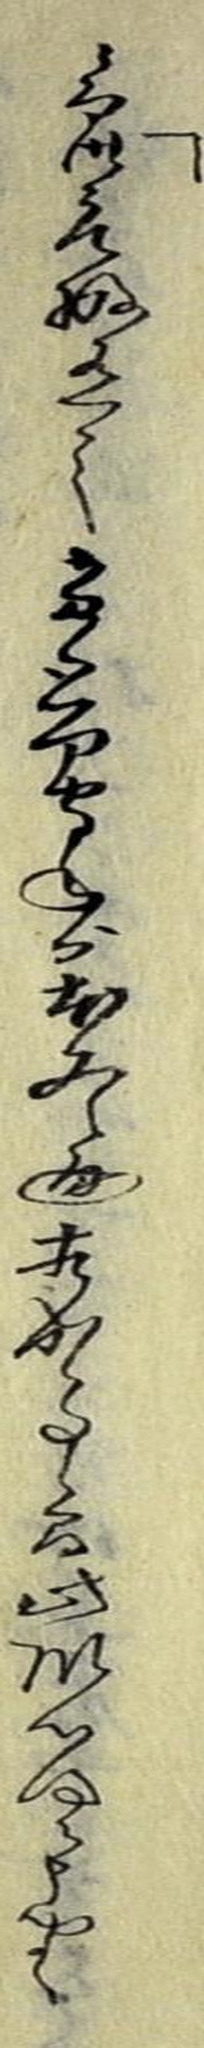に而御取扱有之当御留守年ゟ本文之通相成事に候間此段心得に申聞候
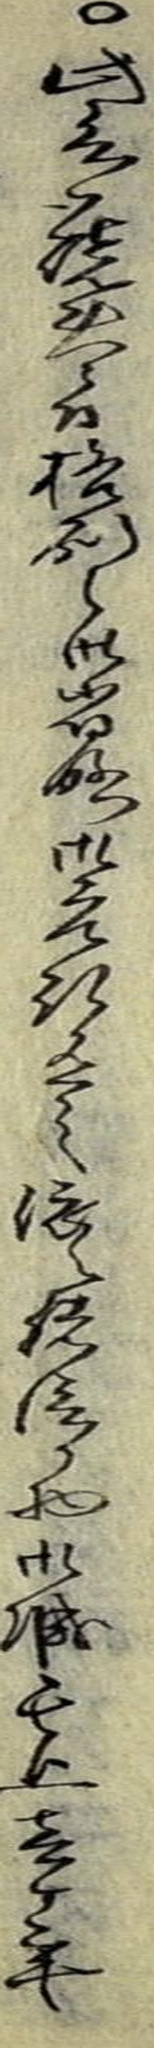○此度御焼失に付格別之御省略御取行有之依之諸渡り物御減其上壱ヶ年
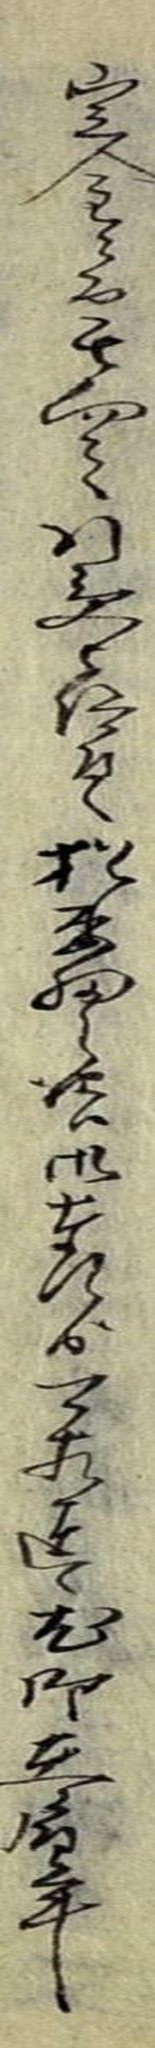定金に而其向々へ引受被仰付候猶委細之儀は御奉行ゟ可相達候尤御在府年
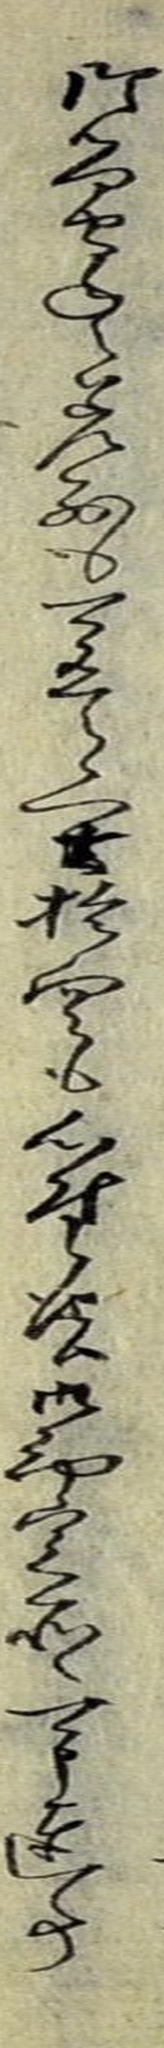御留守年之差別も可有之候へ共於向々も心付之儀は御勘定所へ可申達事
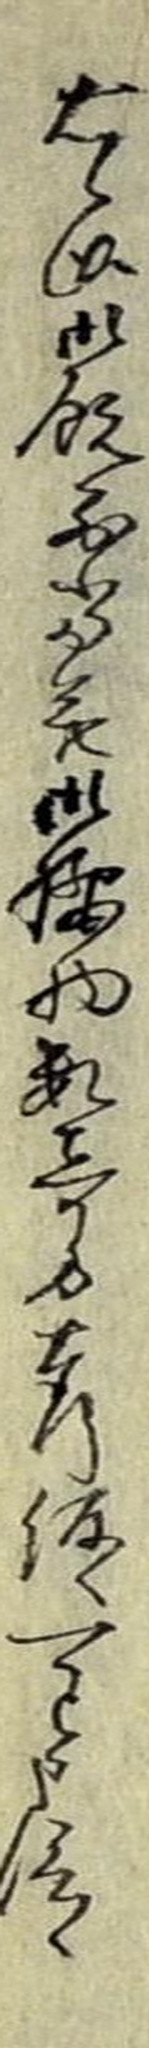右之趣御厩別当并御腰物数気方奉行仮？へ可被申渡候
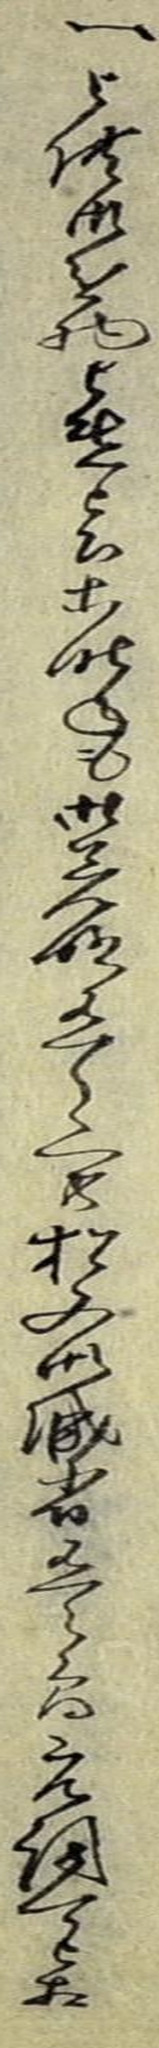一被供御進物被遣被下等昨年も御差略有之候へ共猶又御減省有之候間取調可被相
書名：命令之部 六
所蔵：福井県文書館 Fukui Prefectural Archives
